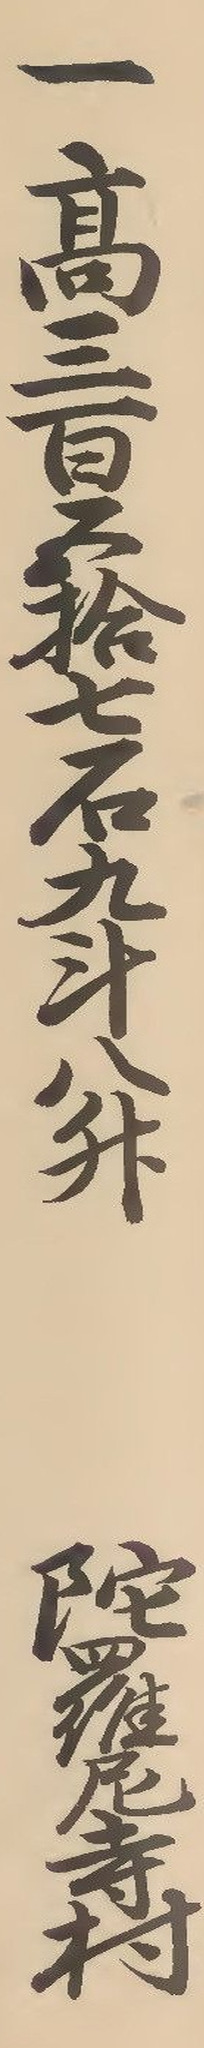一高三百五拾七石九斗八升陀羅尼寺村
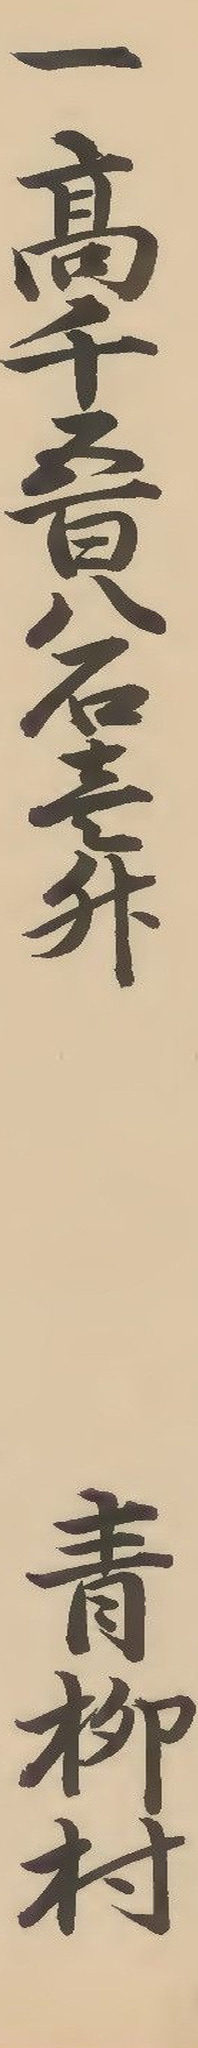一高千五百八石壱升青柳村
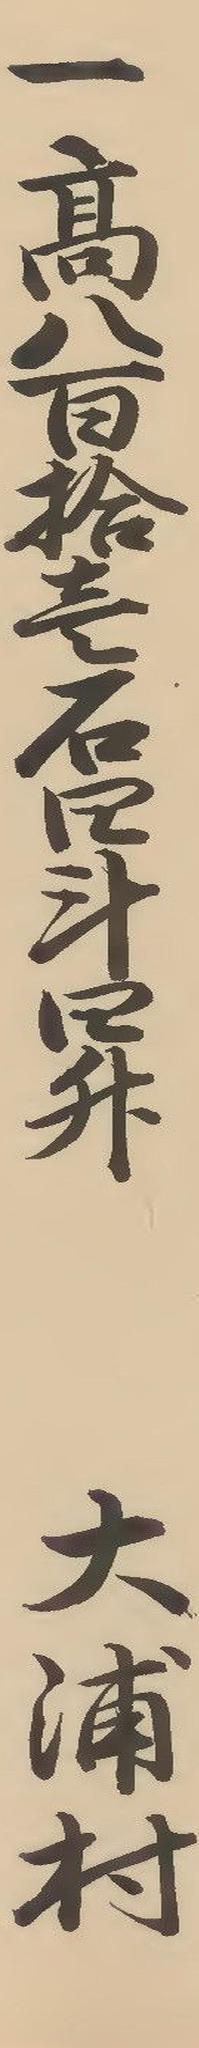一高八百拾壱石四斗四升大浦村
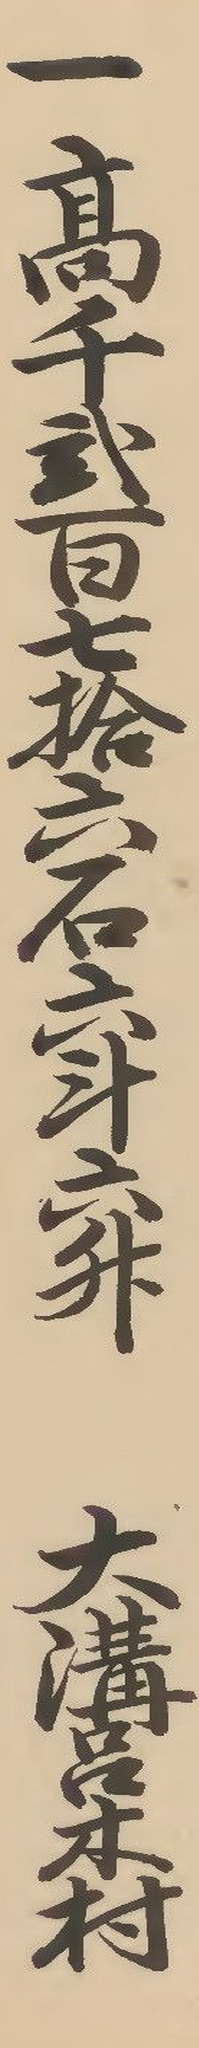一高千弐百七拾六石六斗六升大溝呂木村

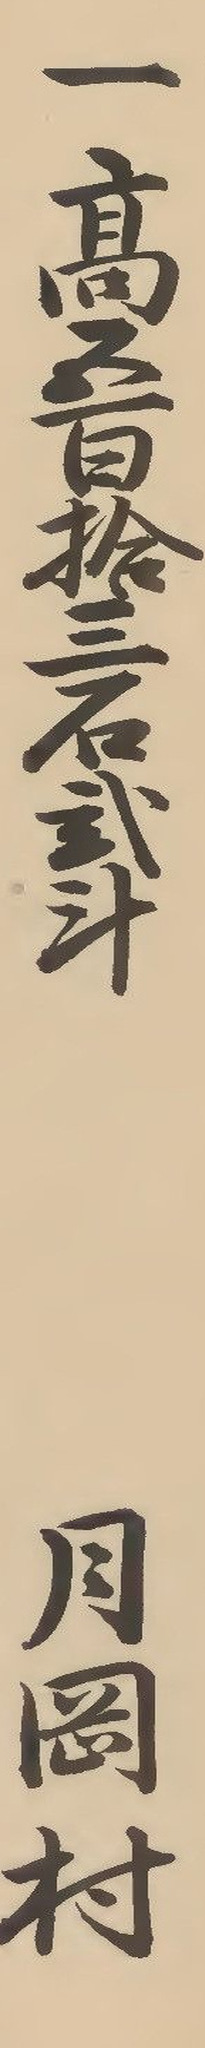一高五百拾三石弐斗月岡村
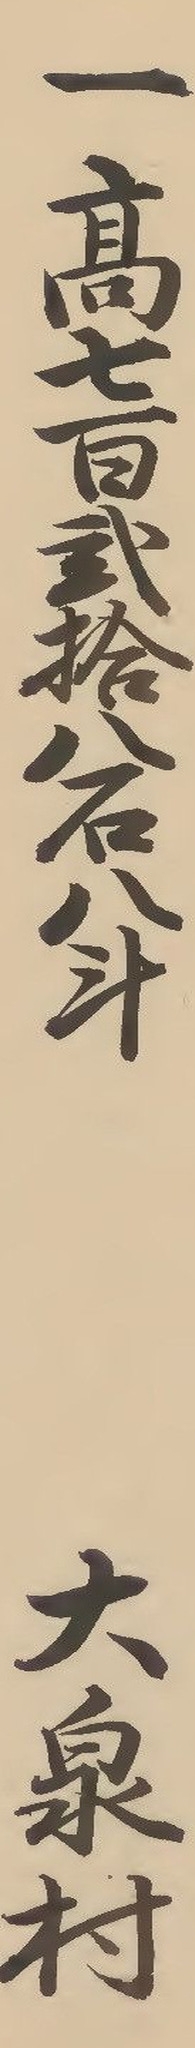一高七百弐拾八石八斗大泉村
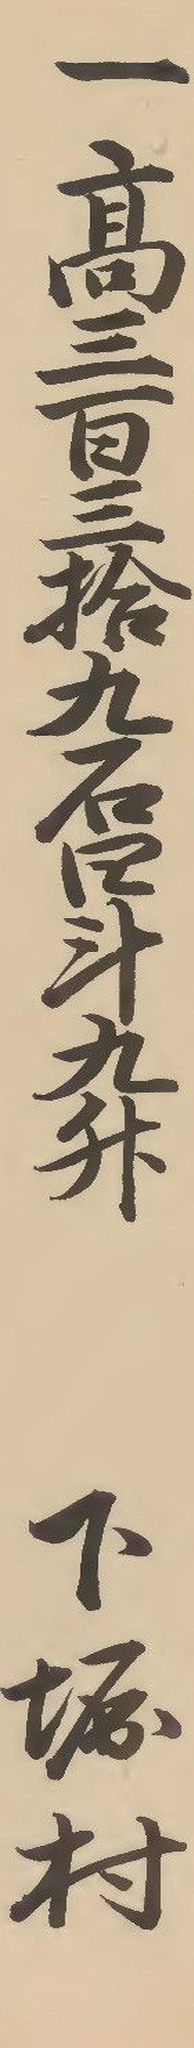一高三百三拾九石四斗九升下堀村
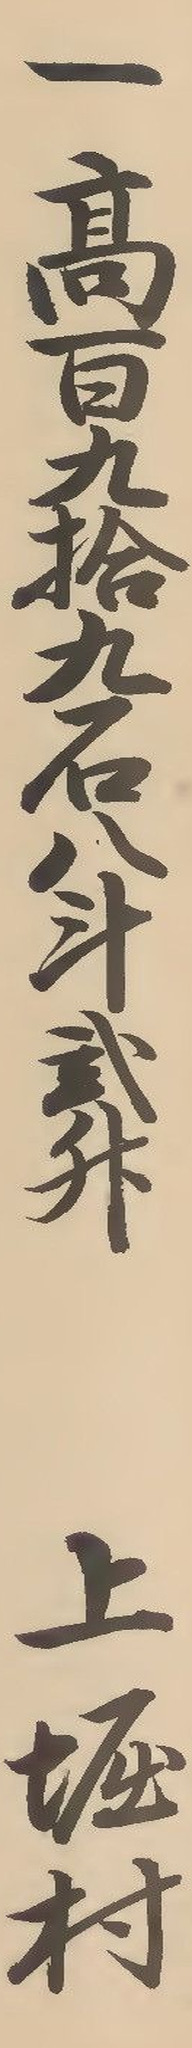一高百九拾九石八斗弐升上堀村
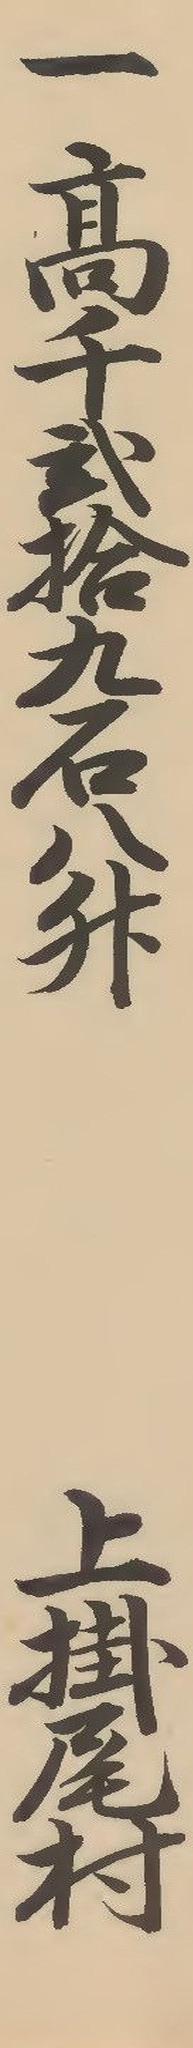一高千弐拾九石八升上掛尾村
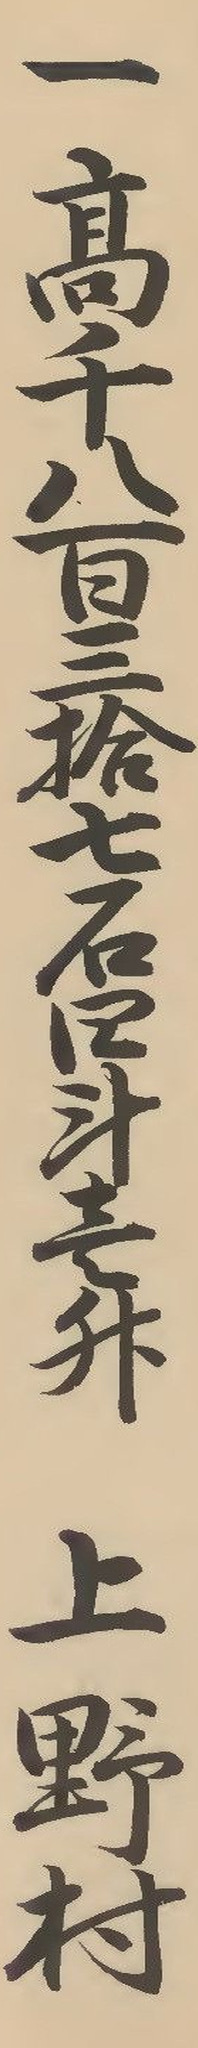一高千八百三拾七石四斗壱升上野村
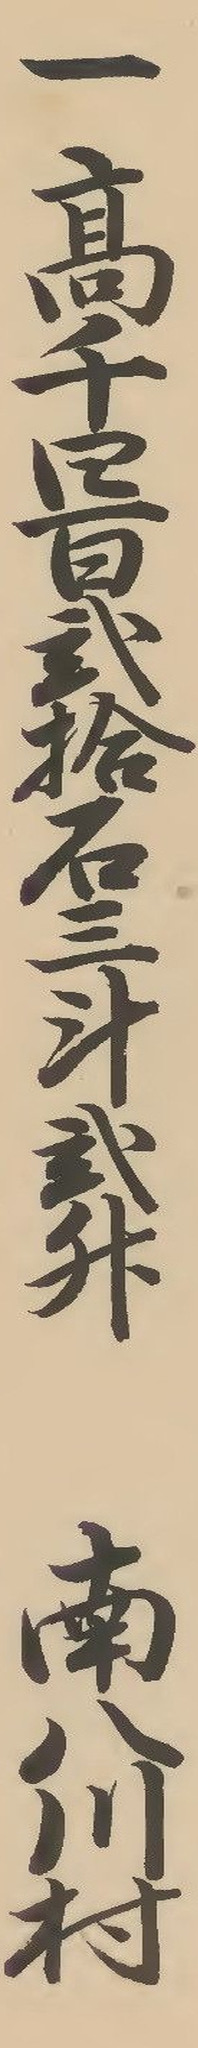一高千四百弐拾石三斗弐升南八川村

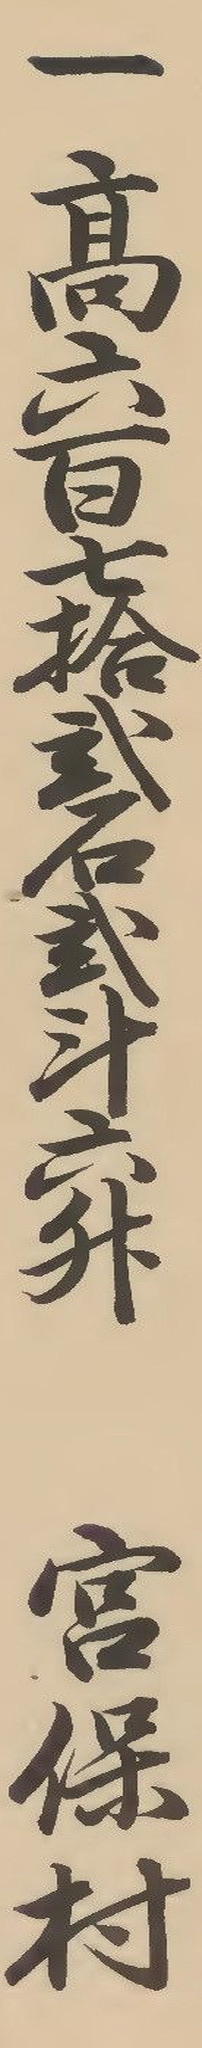一高六百七拾弐石弐斗六升宮保村
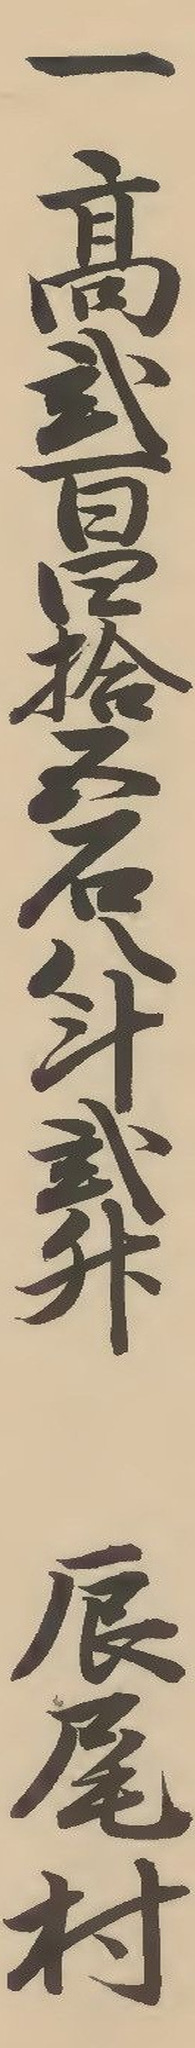一高弐百四拾五石八斗弐升辰尾村
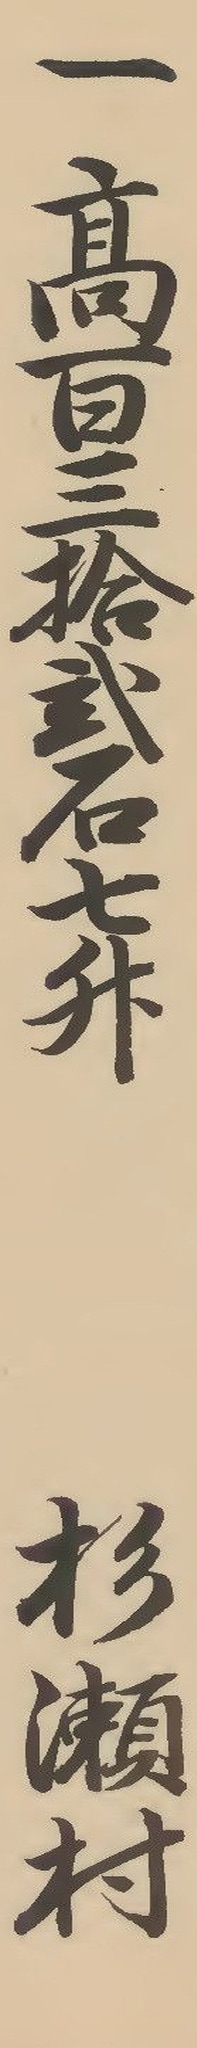一高百三拾弐石七升杉瀬村
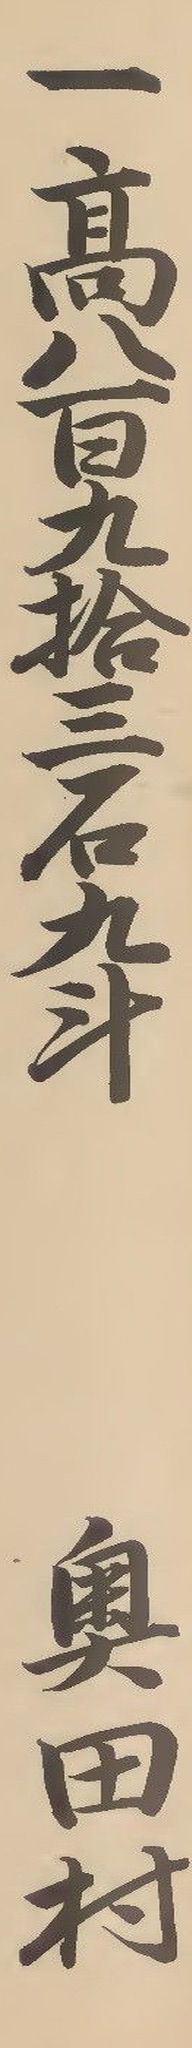一高八百九拾三石九斗奥田村
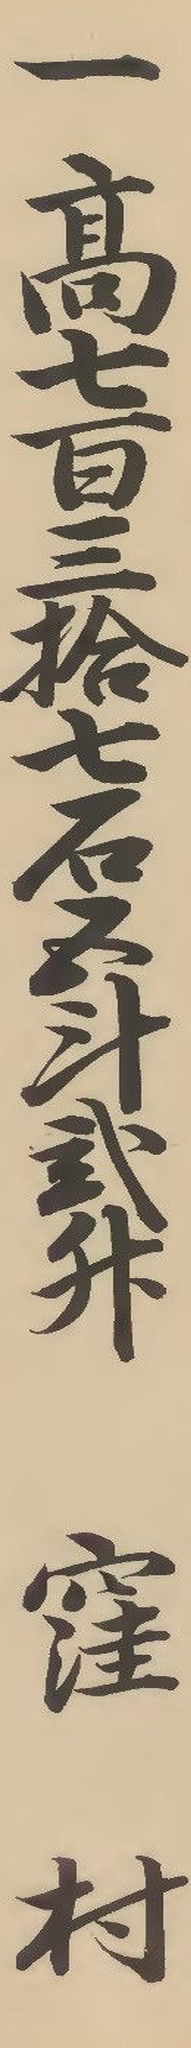一高七百三拾七石五斗弐升窪村
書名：越中国郷帳
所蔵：国立公文書館 National Archives of Japan
